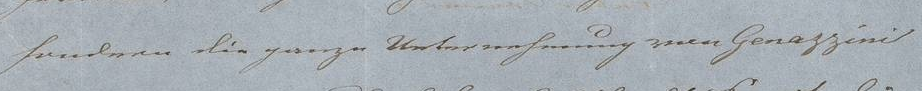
sondern die ganze Unternehmung von Genazzini
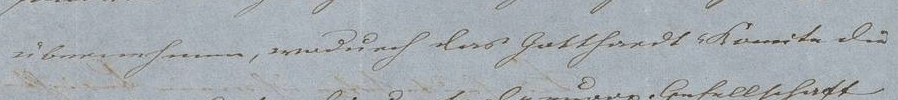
übernehmen, wodurch das Gotthardt-Komite die
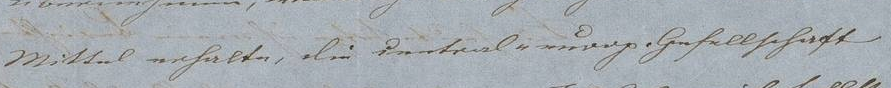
Mittel erhalte, die central-europ. Gesellschaft
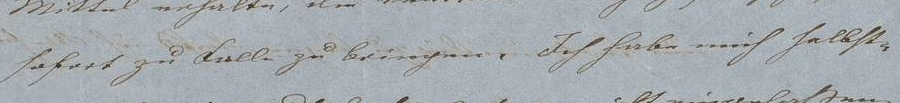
sofort zu Falle zu bringen. Ich habe mich selbst-
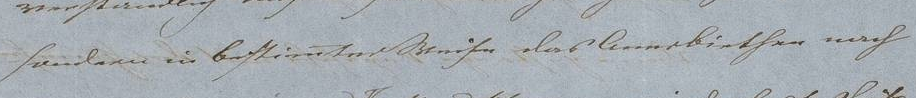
sondern in bestimmter Weise das Anerbiethen nach
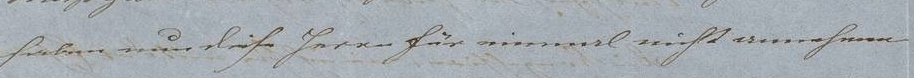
haben nun diese Herrn für einmal nicht annehmen
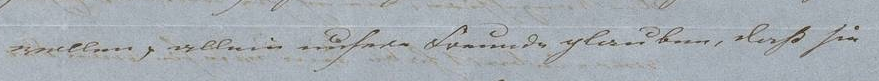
wollen, allein unsere Freunde glauben, daß sie
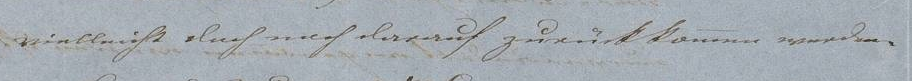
vielleicht doch noch darauf zurückkommen werden.
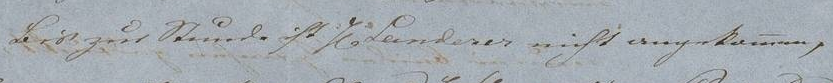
Bis zur Stunde ist H Landerer nicht angekommen,
